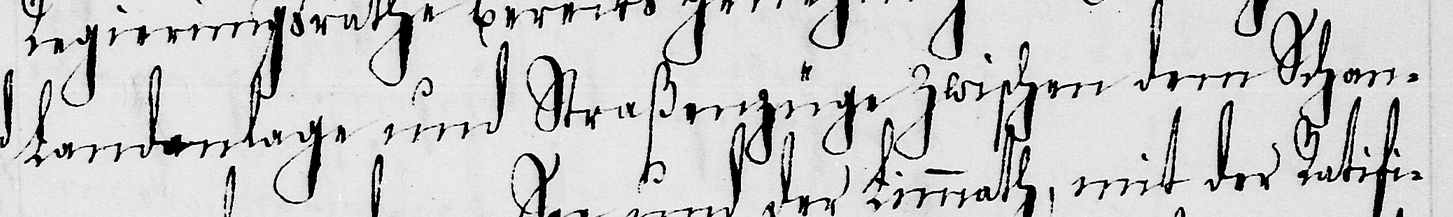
Landanlage und Straßenzüge zwischen dem Schan¬
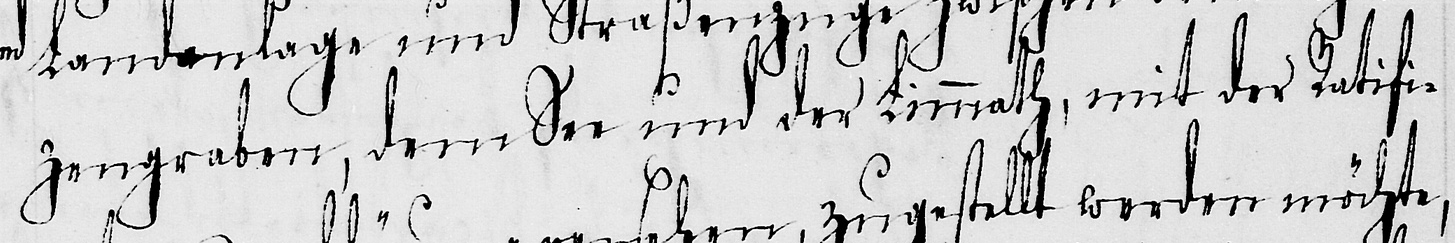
zengraben, dem See und der Limmath, mit der Ratifi¬
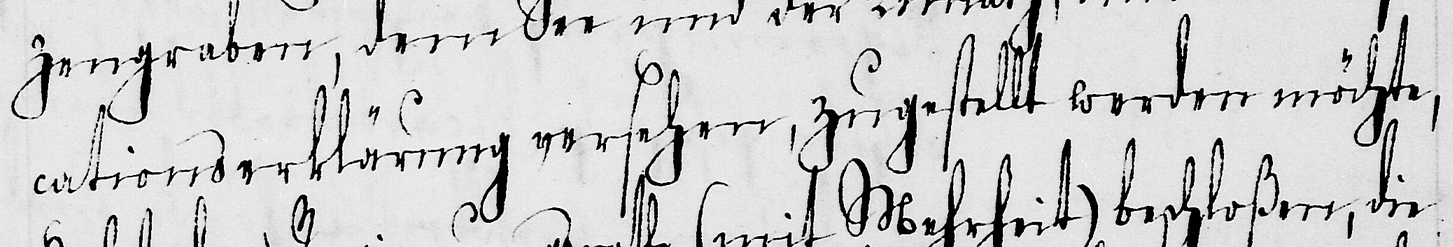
cationserklärung versehen, zugestellt werden möchte,
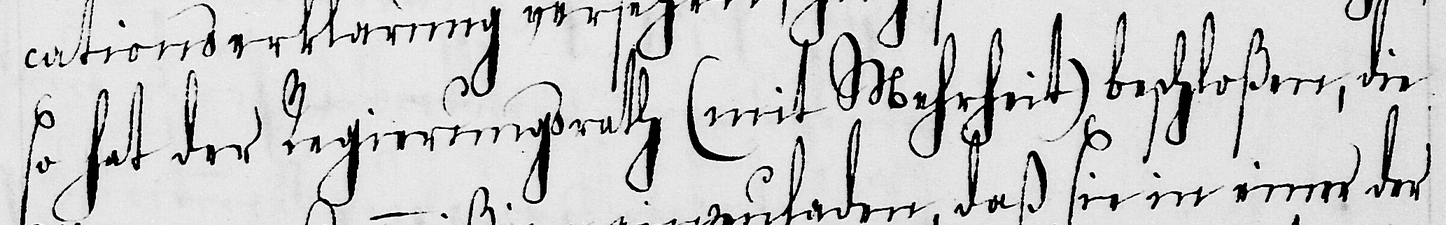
so hat der Regierungsrath (mit Mehrheit) beschloßen, die
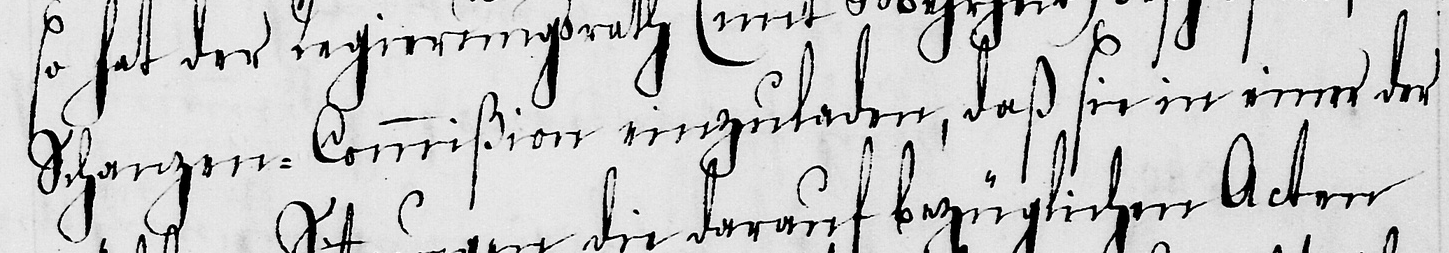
Schanzen-Commißion einzuladen, daß sie in einer der
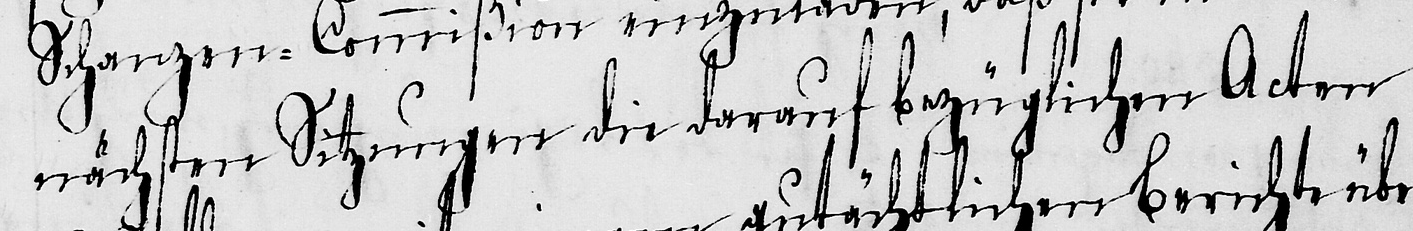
nächsten Sitzungen die darauf bezüglichen Acten
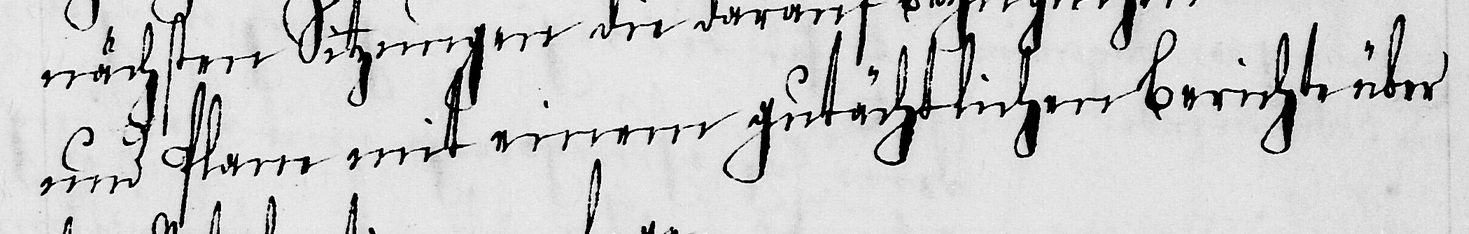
und Plane mit einem gutächtlichen Berichte über
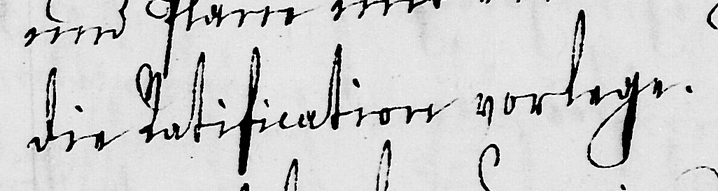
die Ratification vorlege.
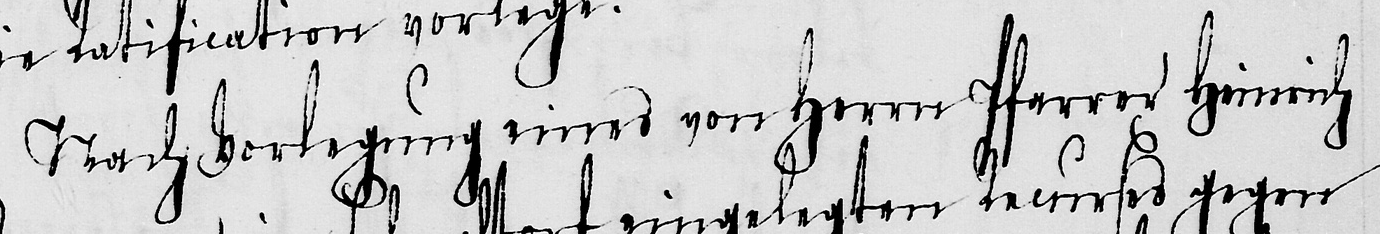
Nach Vorlegung eines von Herrn Pfarrer Heinrich
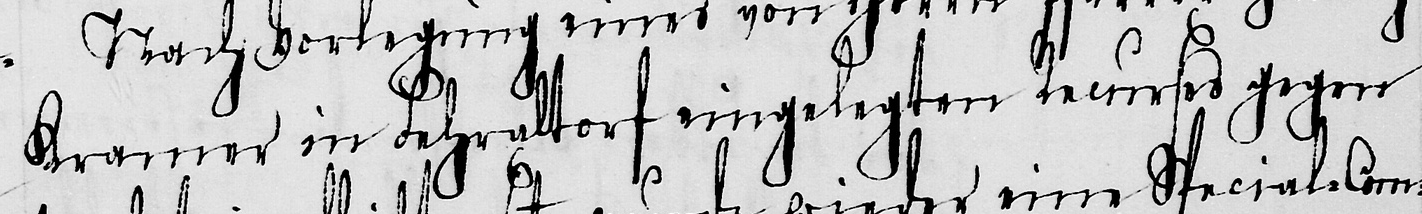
Kramer in Fehraltorf eingelegten Recurses gegen
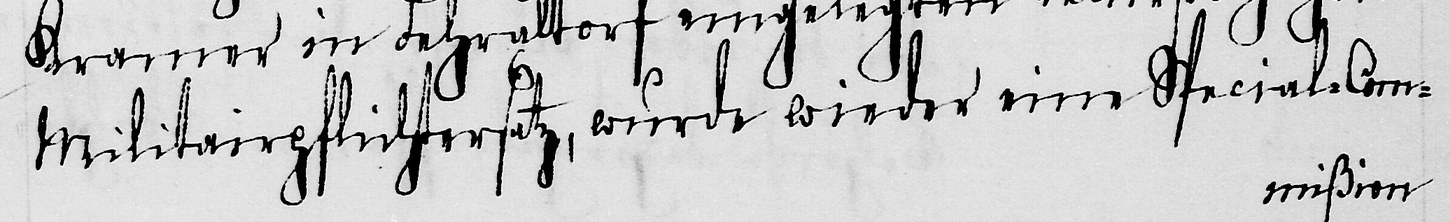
Militairpflichtersatz, wurde wieder eine Special-Com-
